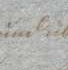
über die
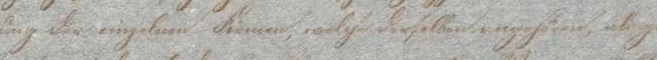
der einzelnen Firmen, welche derselben angehörten, als
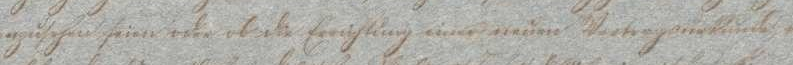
anzusehen seien oder ob die Errichtung einer neuen Vertragsurkunde, in
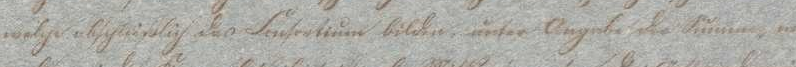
welche abschließlich das Consortium bilden, unter Angabe der Summe, mit
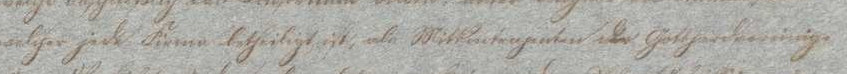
welcher jede Firma betheiligt ist, als Mitkontrahenten der Gotthardsvereinig-
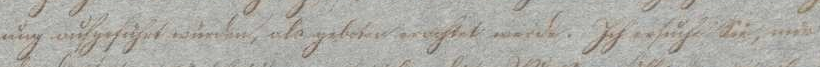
ung aufgeführt würden, als geboten erachtet werde. Ich ersuche Sie, mir
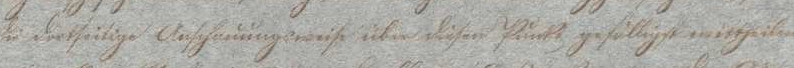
die dortseitige Anschauungsweise über diesen Punkt gefälligst mittheilen
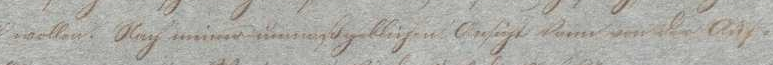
zu wollen. Nach meiner unmaßgeblichen Ansicht kann von der Auf-
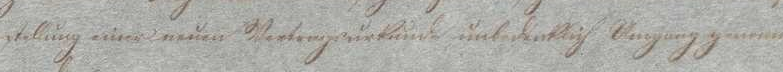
stellung einer neuen Vertragsurkunde unbedenklich Umgang genommen
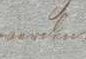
werden
